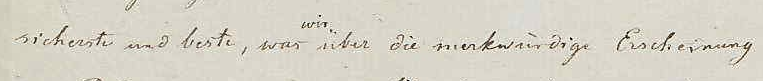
sicherste und beste, was wir über die merkwürdige Erscheinung
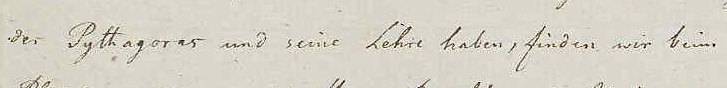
des Pythagoras und seine Lehre haben, finden wir beim
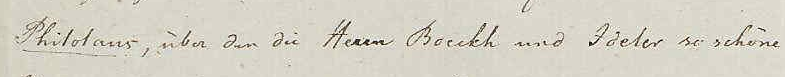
Philolaus, über den die Herrn Boeckh und Ideler so schöne
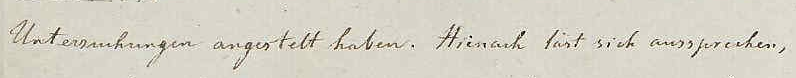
Untersuchungen angestelt haben. Hienach läst sich aussprechen,
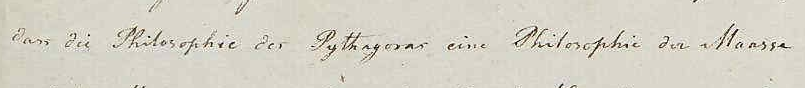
dass die Philosophie des Pythagoras eine Philosophie der Maasse
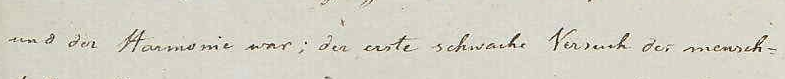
und der Harmonie war; der erste schwache Versuch des mensch-
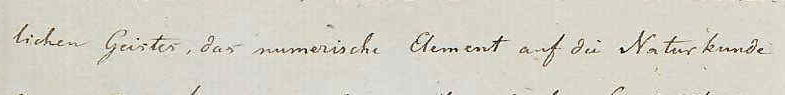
lichen Geistes, das numerische Element auf die Naturkunde
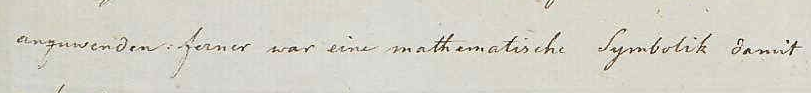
anzuwenden: ferner war eine mathematische Symbolik damit
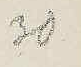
nicht
